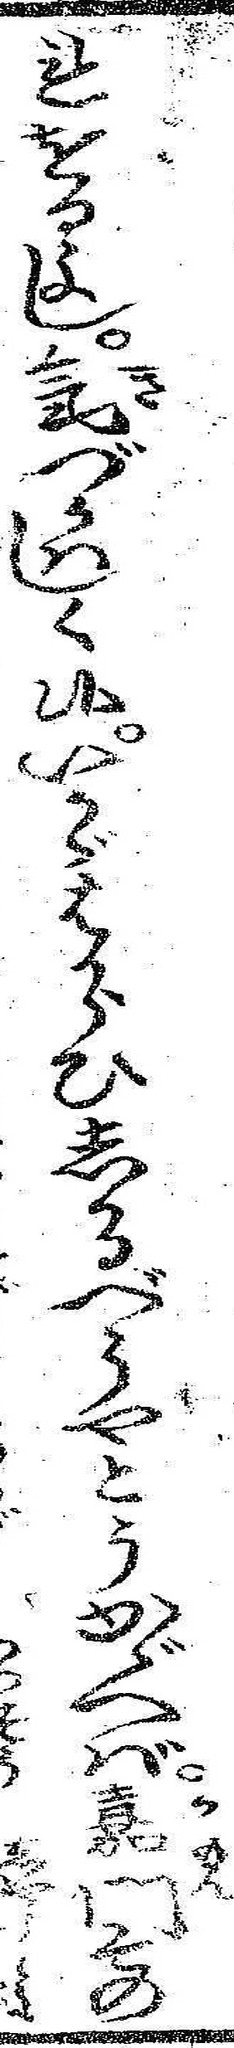れをるよし。気づかはしく候。いかゞはからひしかるべうやとうかゞへば。嘉門その
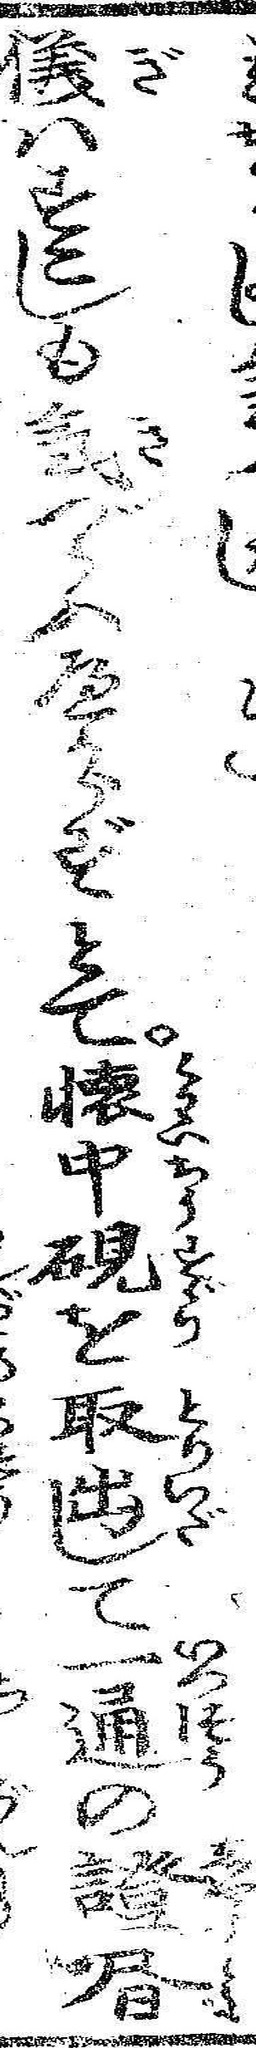儀はすこしも気づかふへからずとて。懐中硯を取出して一通の証書
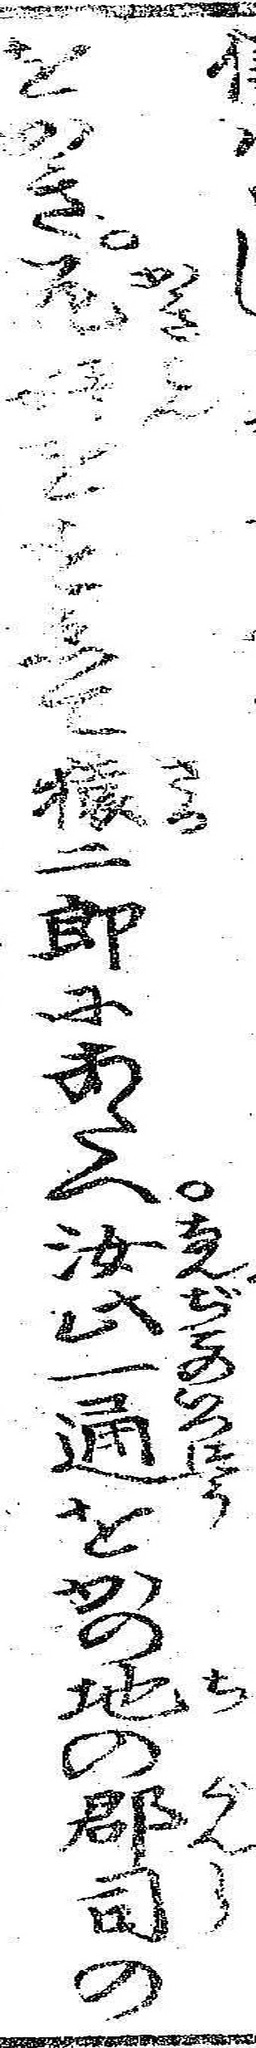をかき。花押をすゑて猿二郎にあたへ。汝此一通をかの地の郡司の
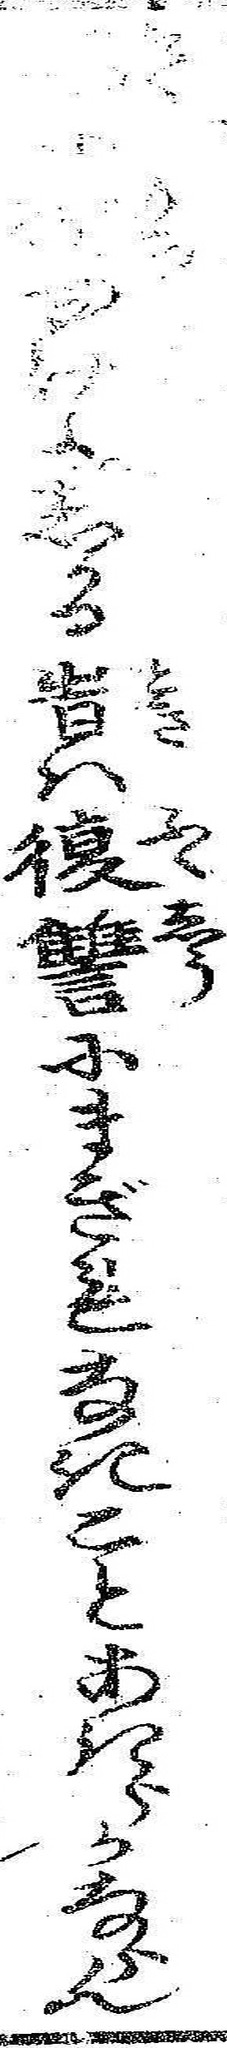に持ゆけよ。しかる時は復讐にまぎれなきことあきらかならん
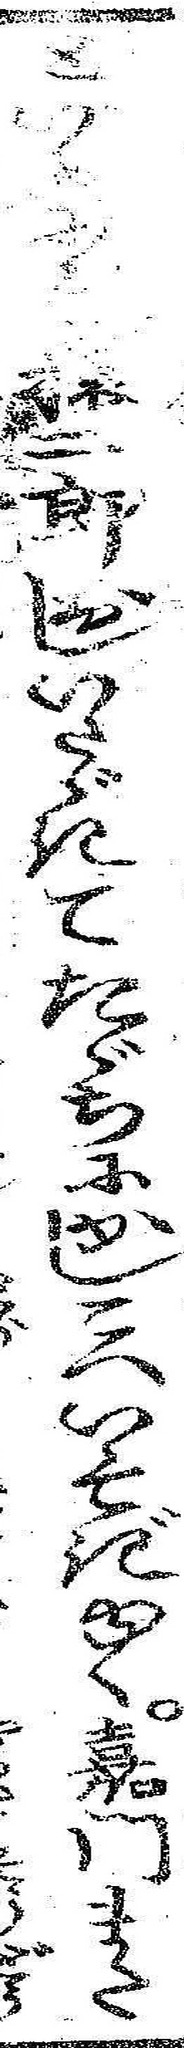といに猿二郎おしいたゞきてたゞちにかしこへいそぎゆく。嘉門また
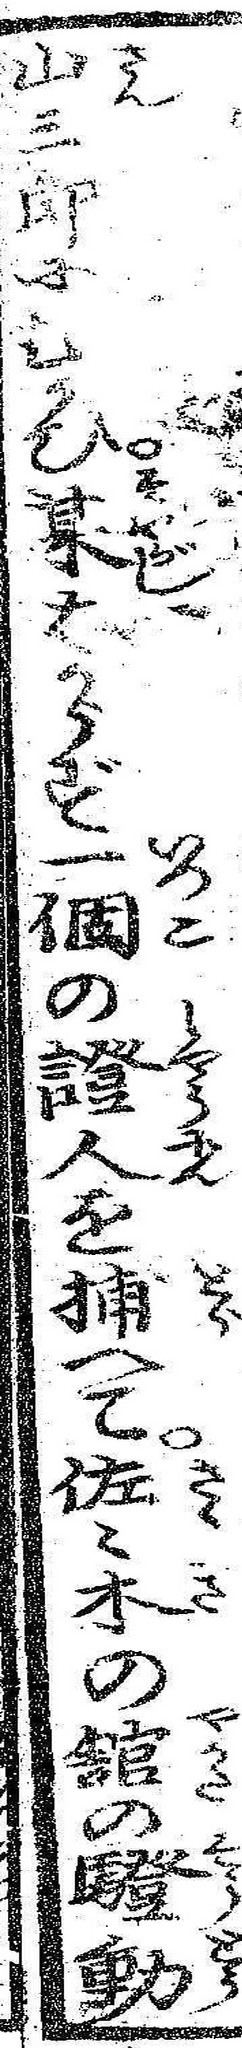山三郎にむかひ。某はからず一個の証人を捕へて。佐々木の館の䮴動
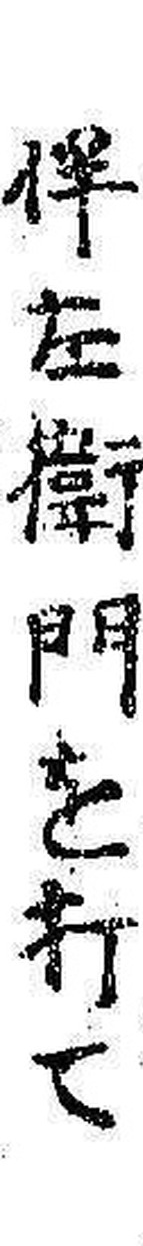伴左衛門を打て
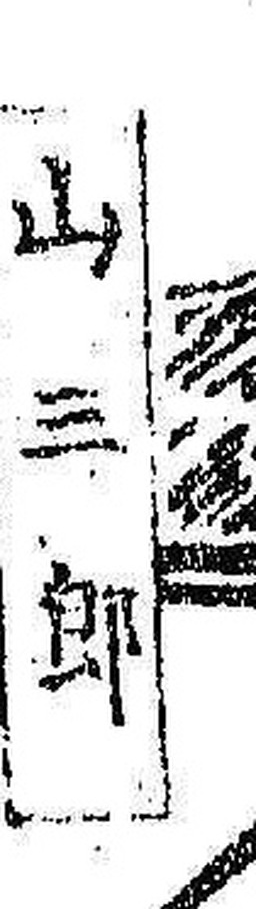山三郎
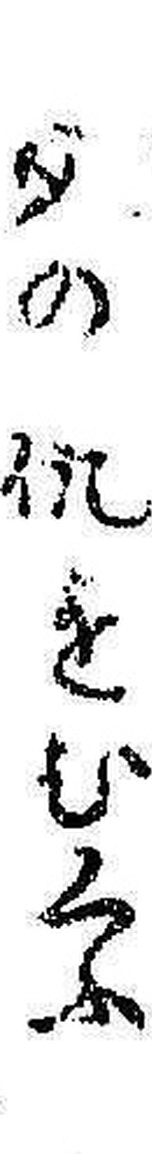父の仇をむくふ
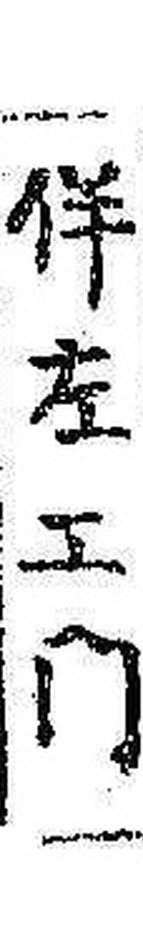伴左エ門

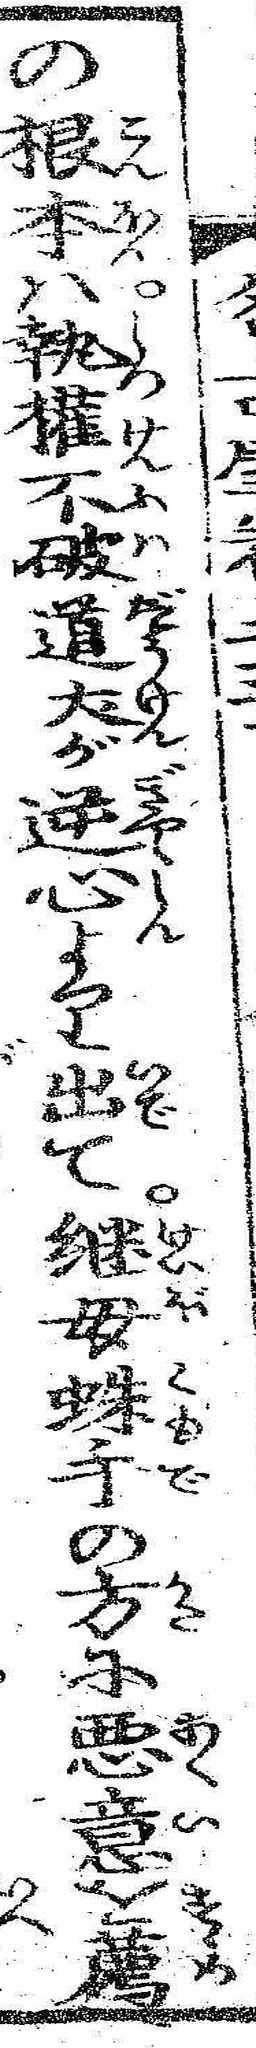の根本は。執権不破道犬が逆心より出て。継母蛛手の方に悪意を薦
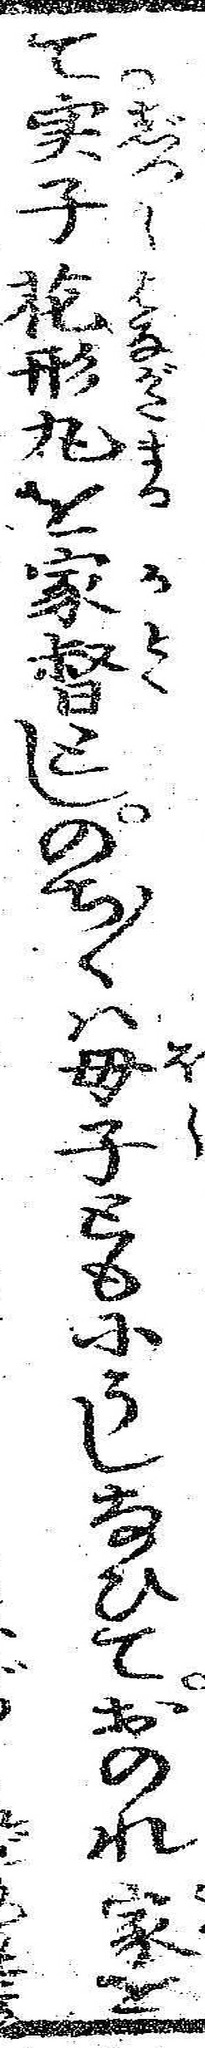て。実子花形丸を家督とし。のち〳〵は母子ともにうしなひて。おのれ家を
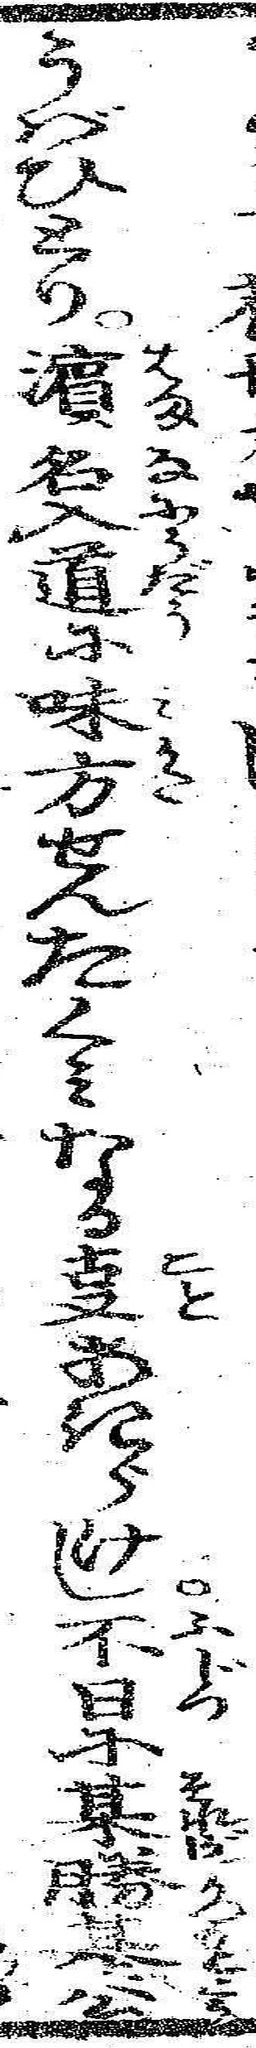うばひとり。浜名入道に味方せんたくみなる事あきらけし。不日に某勝基公
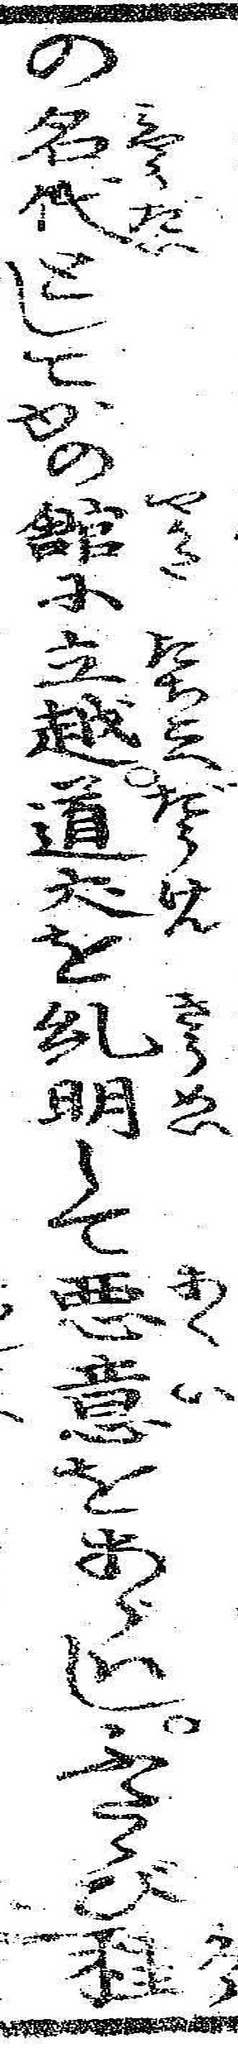の名代としてかの館に立越。道犬を糺明して悪意をあらはし。ふたゝび桂
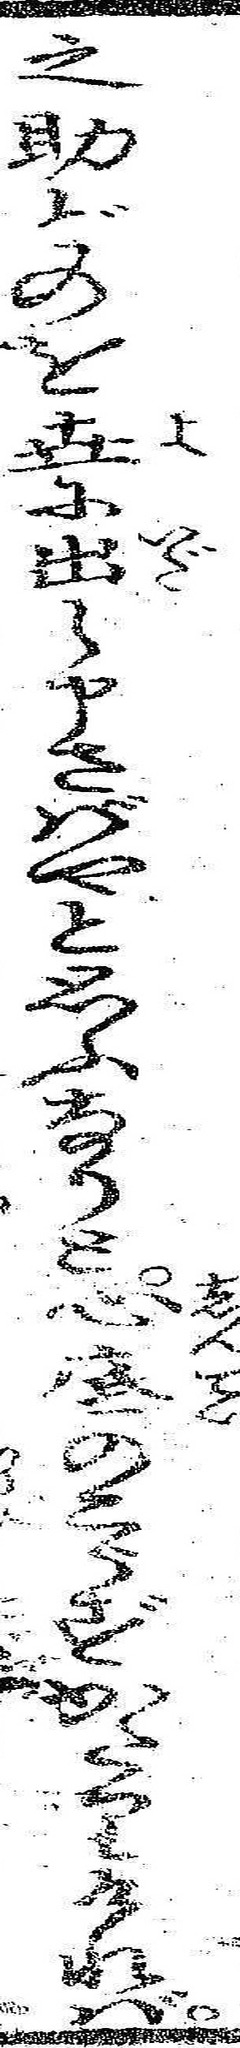之助どのを世に出し申さばやと思ふなりと。心底のこらずかたりければ。
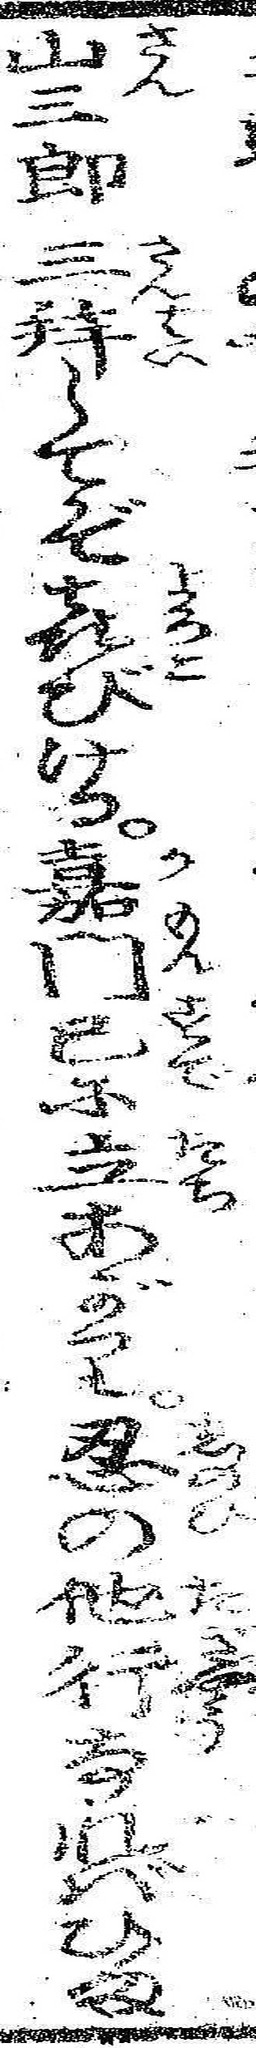山三郎三拝してぞ㐂びける。嘉門已に立あがり。忍の他行なればひま
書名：昔話稲妻表紙
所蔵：国文学研究資料館
